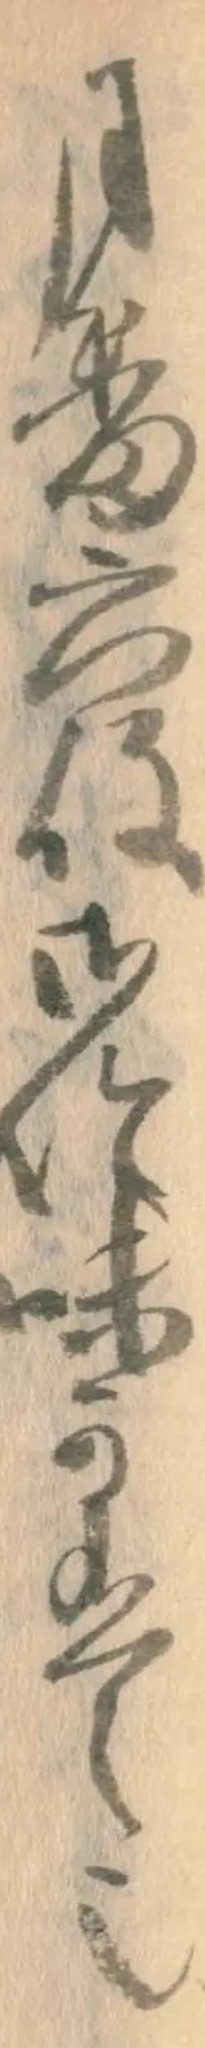月番六役御吟味可有之也
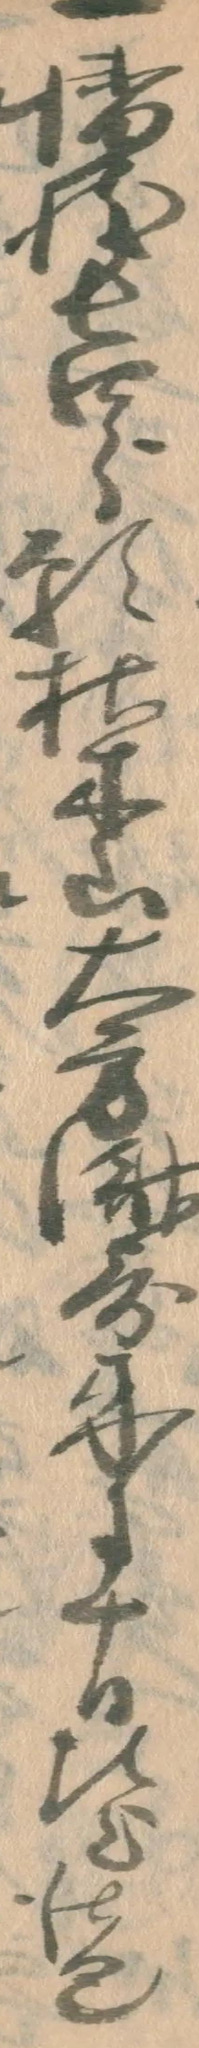一幡枝長四郎願枯木山大方済寄来月十日比迄仕廻
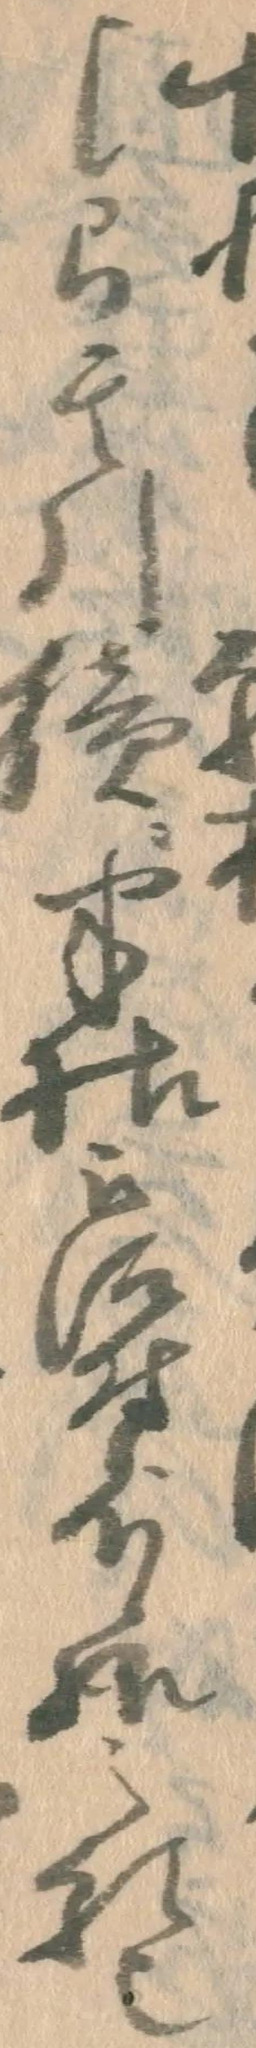申候間其引積ニ半枯被仰付下候様之願也
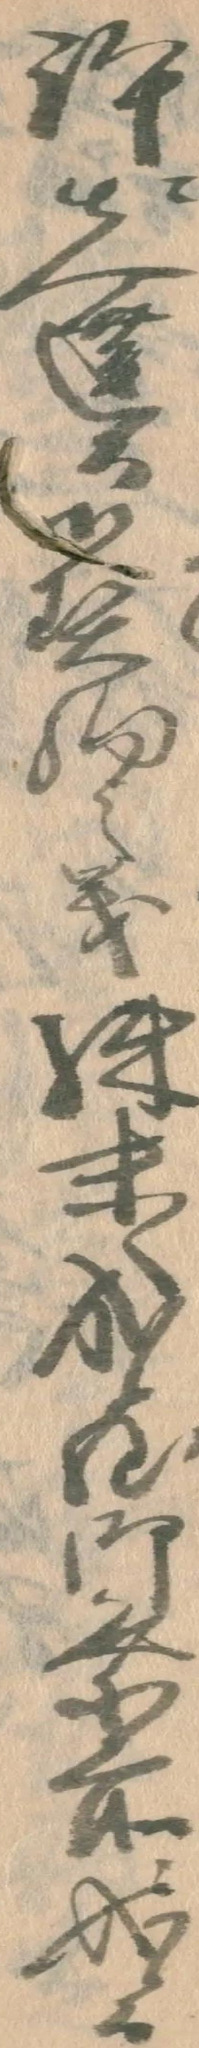評ニ先達而御契約之義殊末へ成程御祭所ニ成候而
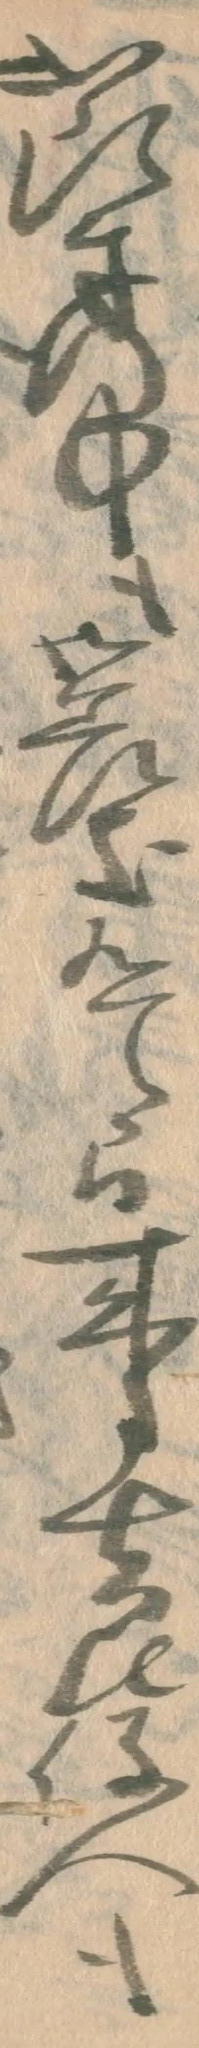出頭奉行中も御差支有之候間来月七日比御役人も
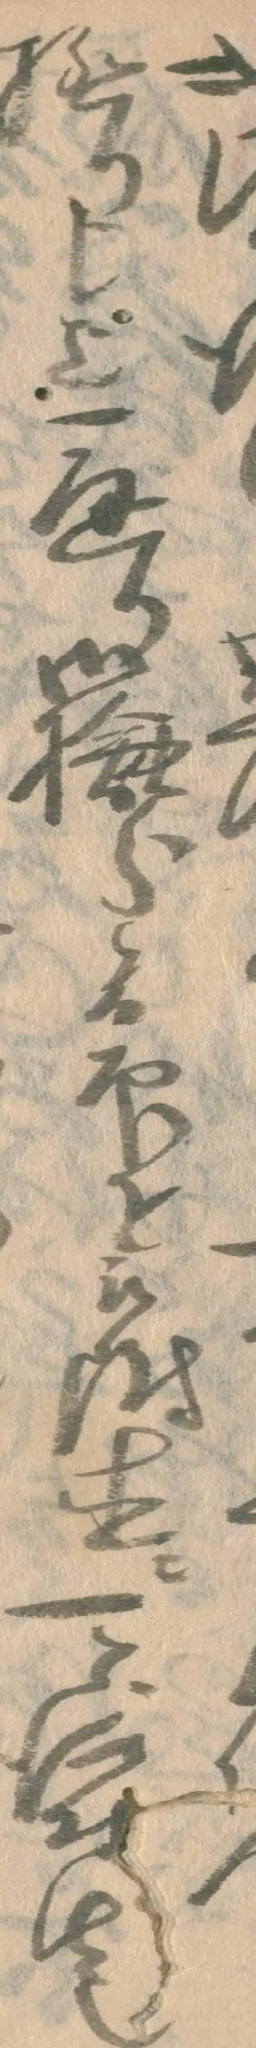極り申候上一通り御検分ニ而印を被附置ニ可被仰付由也
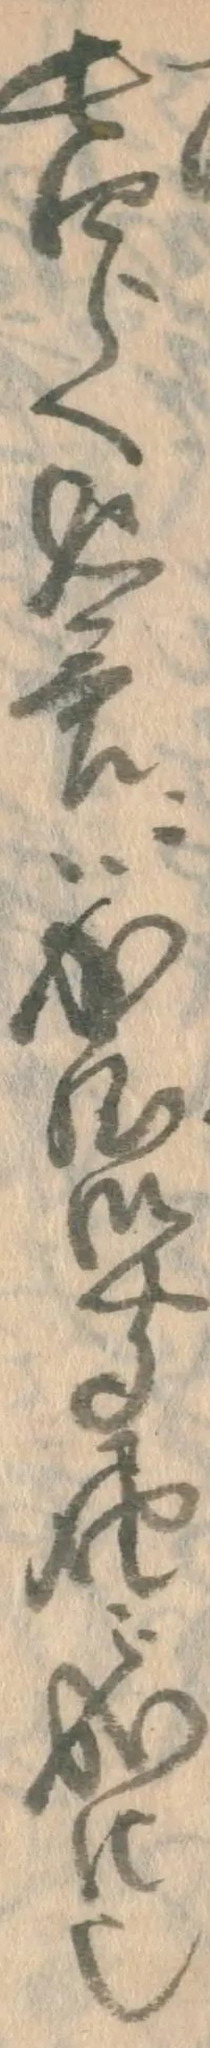長四郎へ返答ニハ成程御聞届被成由也
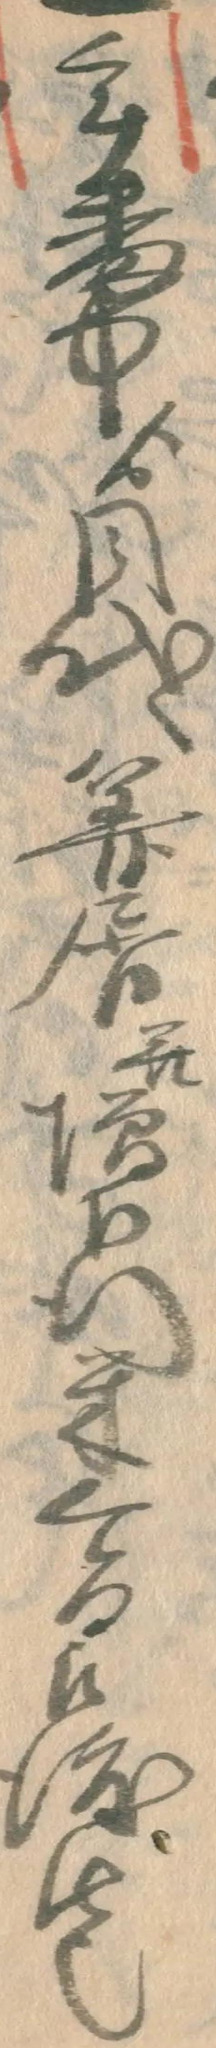一年番中ゟ目代へ算屑幷増下行米今日被渡由也
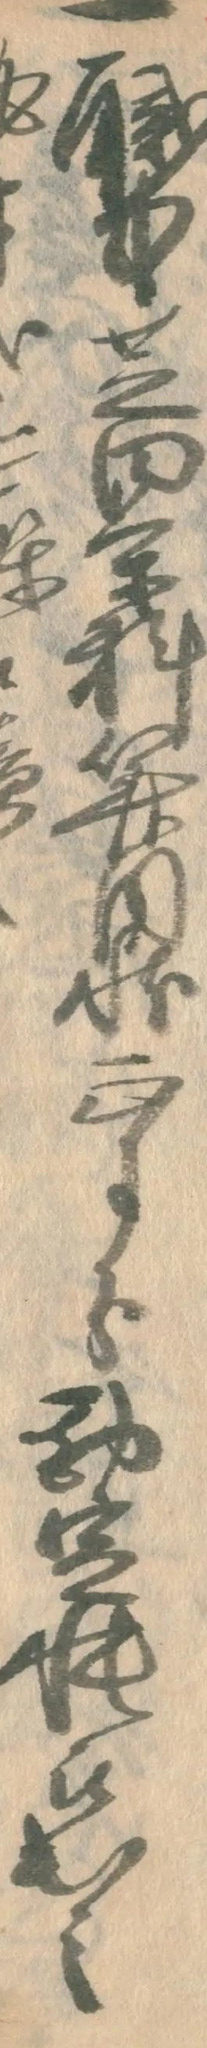一職中芝田楽料算用状正月分勘定帳被出之
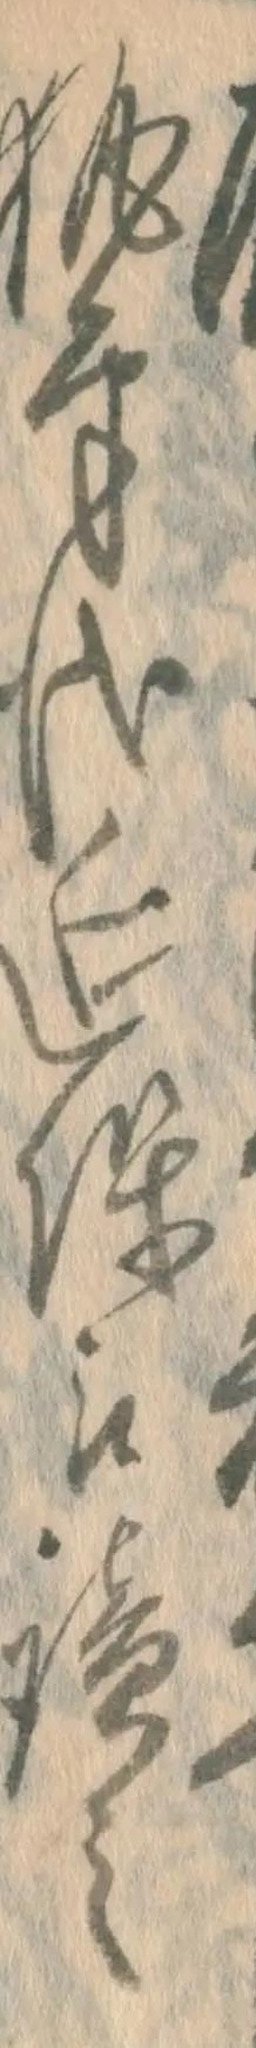執筆代延保被読之
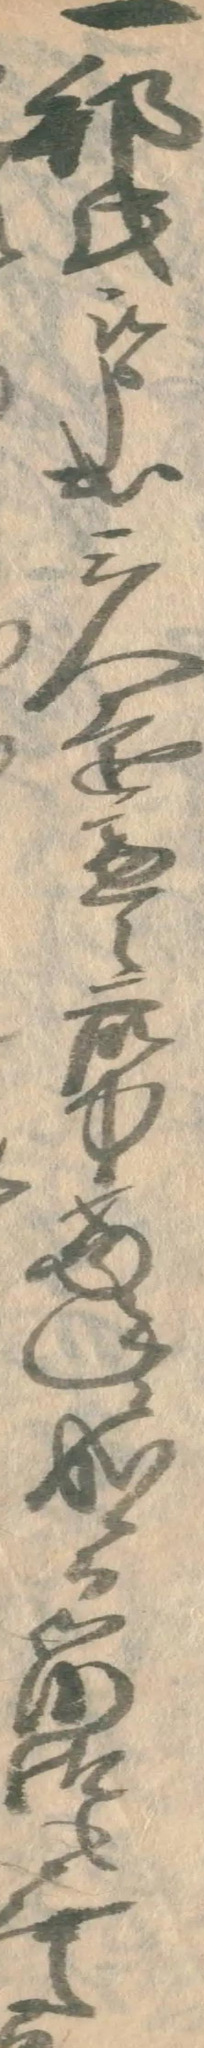一邦氏被申出三人遠慮之衆中当年ニ成候而御沙汰も無之間
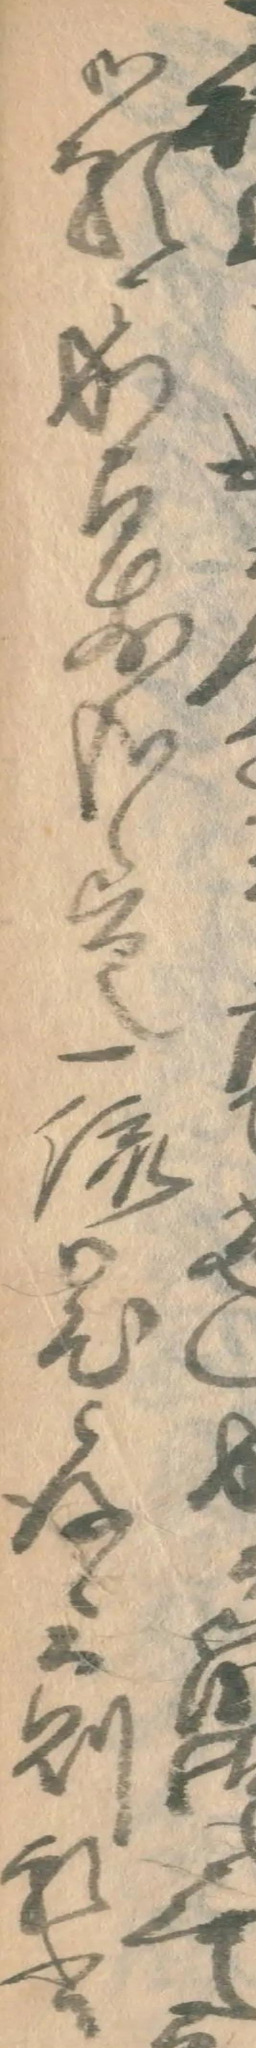御願被成間敷哉之旨也一統御尤被存候而則願書

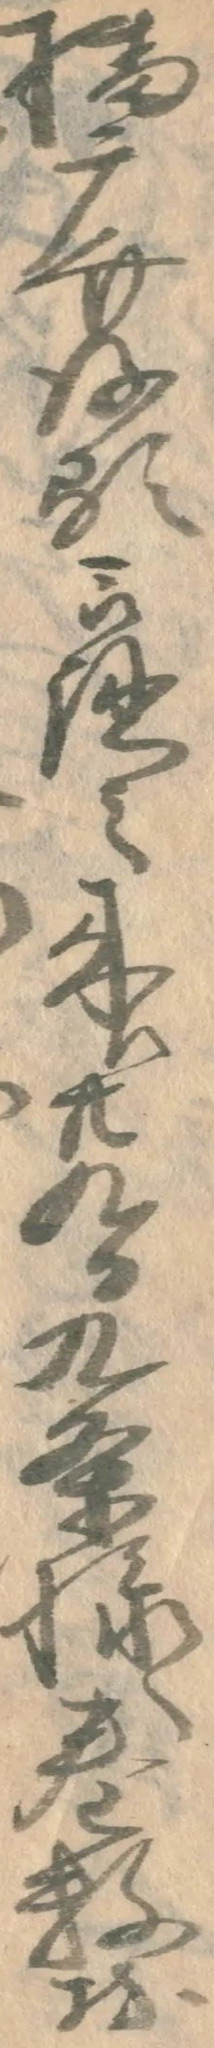播磨介存顕被認之来ル廿九日九条様へ巻数持
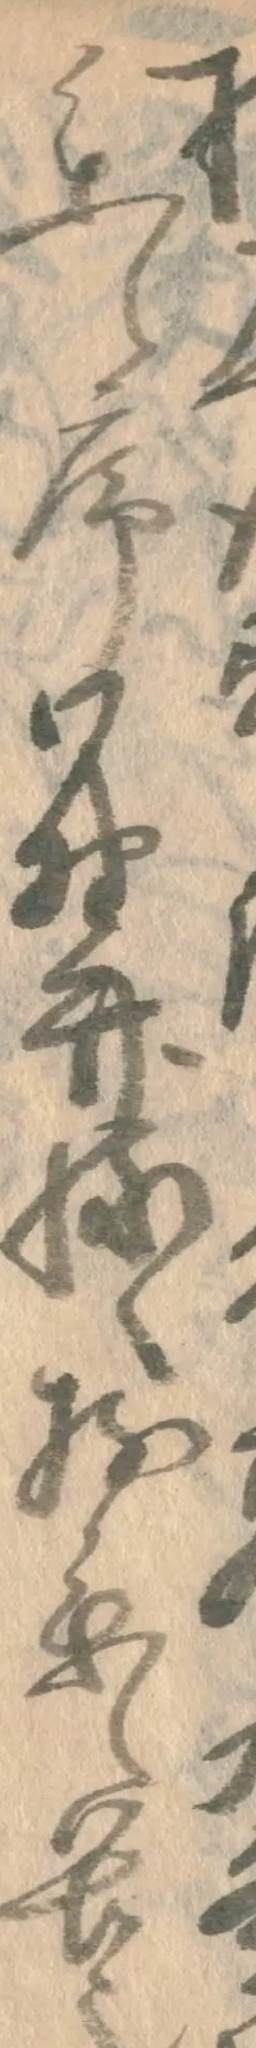参候序日野弁様へ持参之筈也
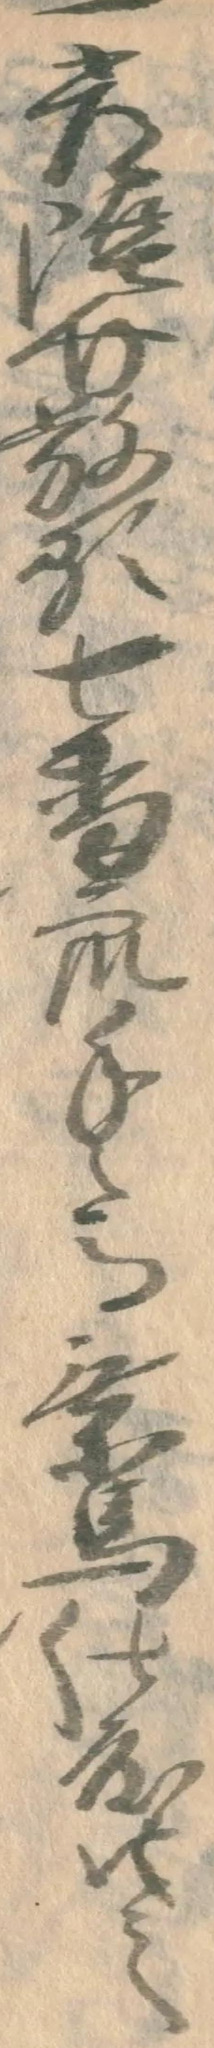一常陸介敬顕七番衆手之馬乗馬仕度由之
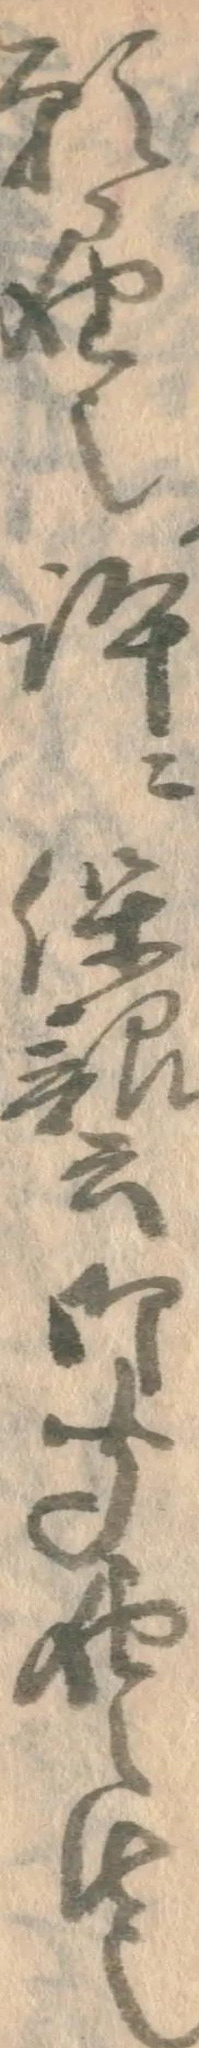願届也評ニ保韶云御聞届之由也
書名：賀茂社記録. 第60冊
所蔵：国立国会図書館 National Diet Library, JAPAN
